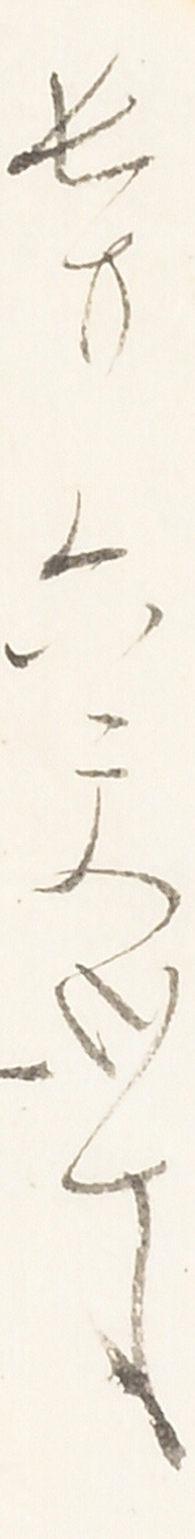長サ六尺弐丁
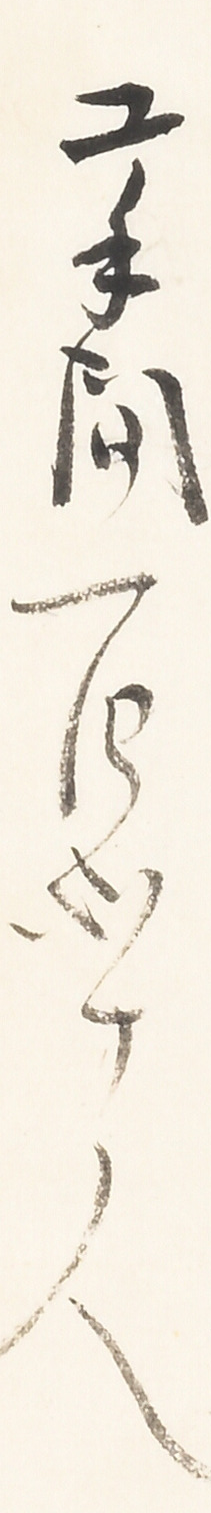工手間百弐十人
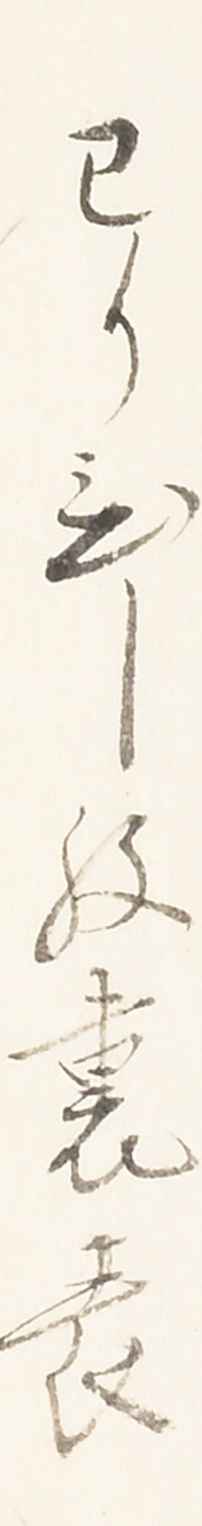わりひし板裏表
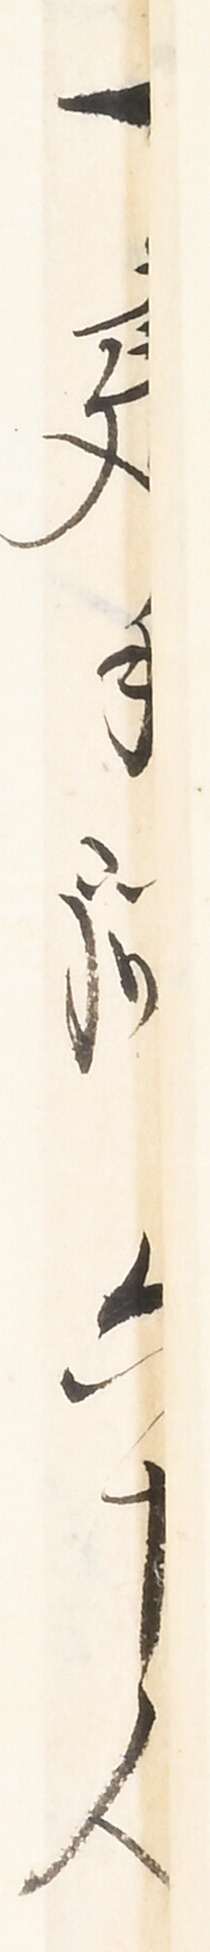一建手間六十人
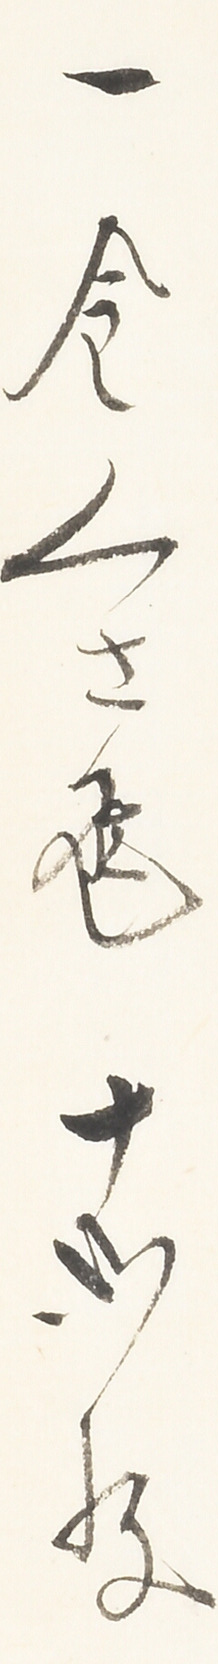一金くさ十弐枚
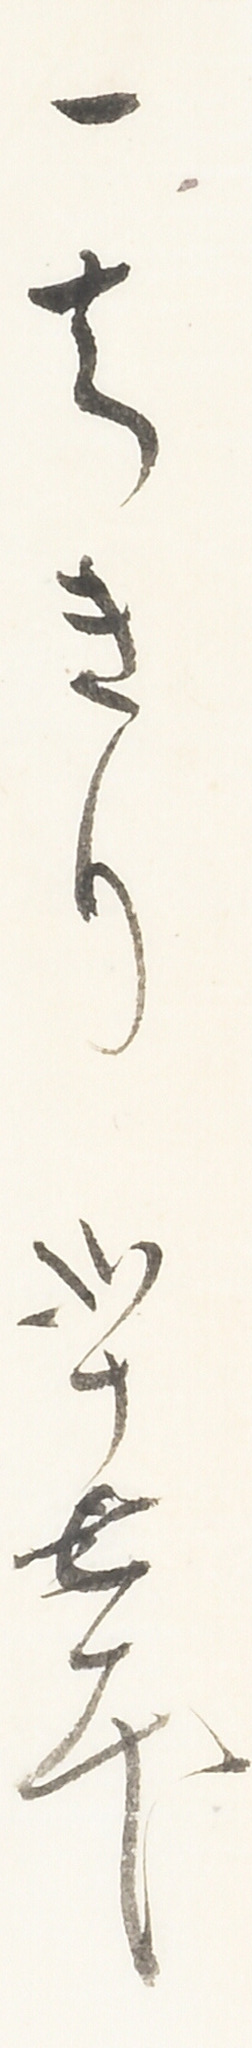一ちきり弐十七本
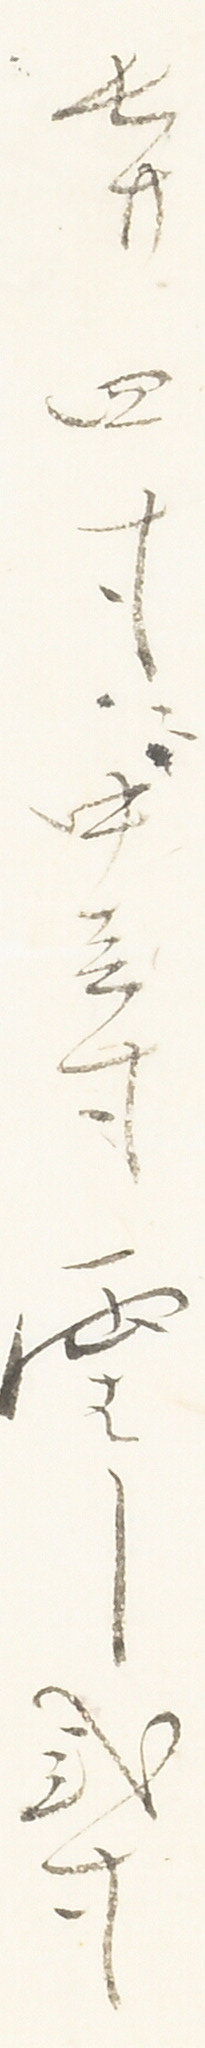長サ四寸中壱寸両はし弐寸
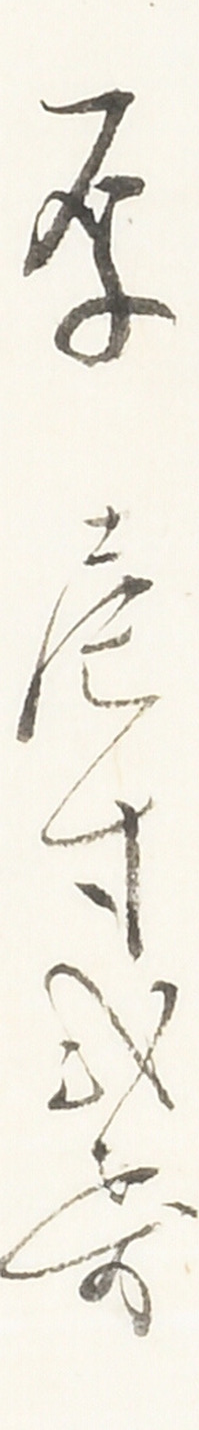厚壱寸弐歩
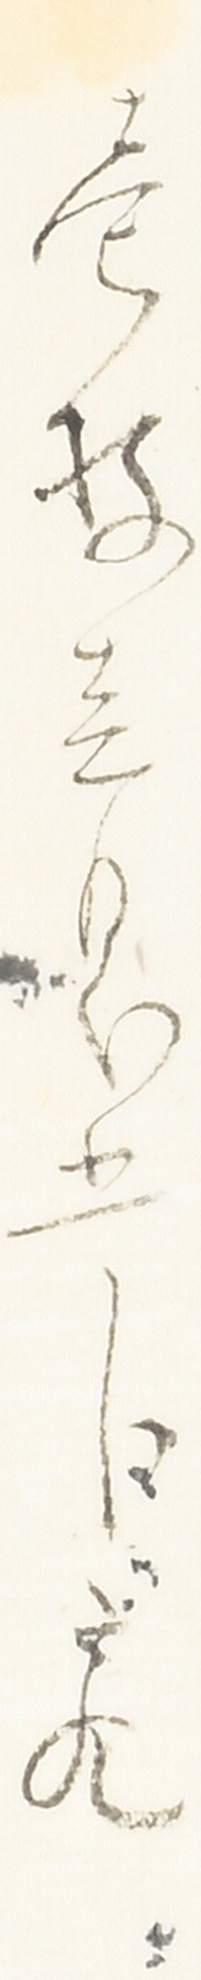壱枚壱匁五分宛

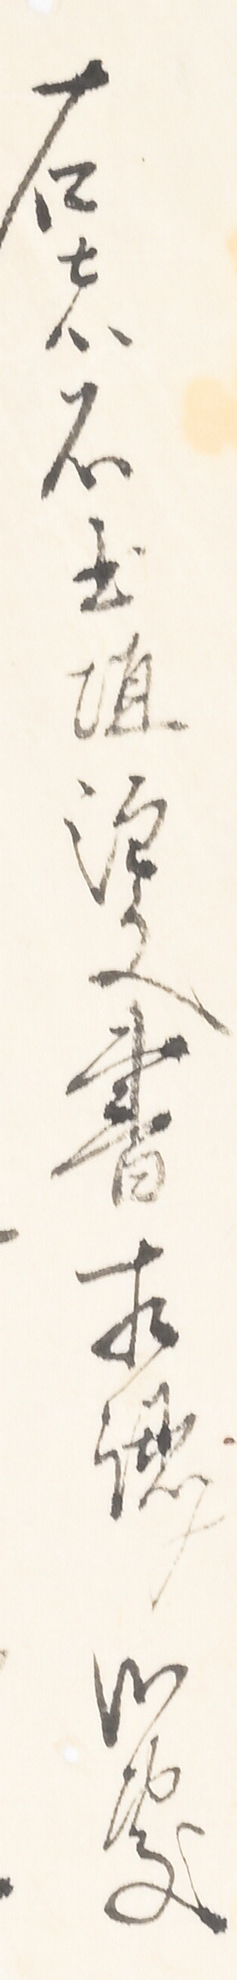右者石玉垣泡文書相認メ候処
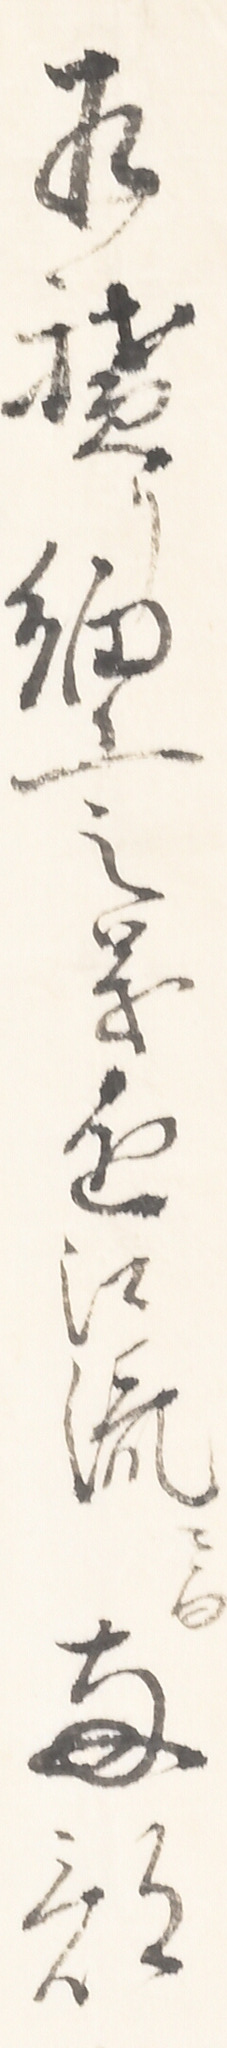相積リ細工之義近江流ニ而両部之
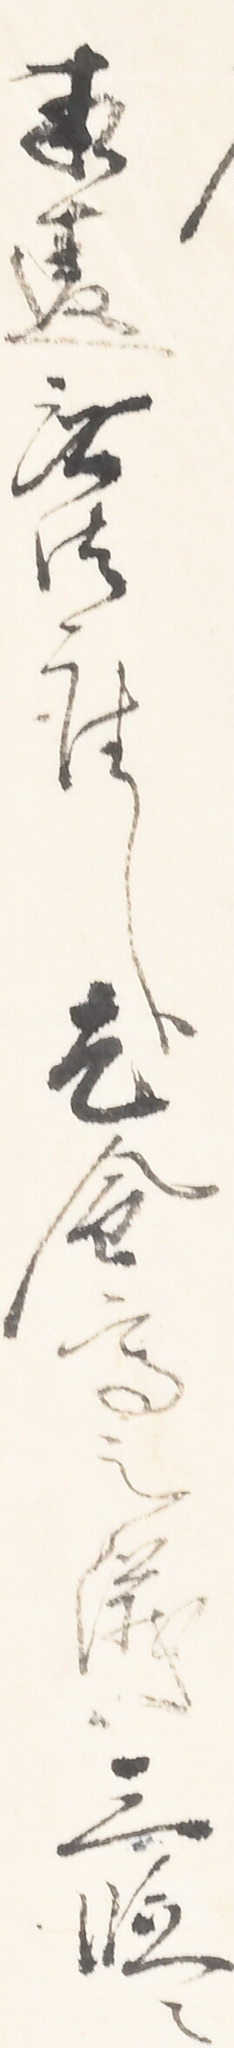相違無御座候尤金高之儀者三段之
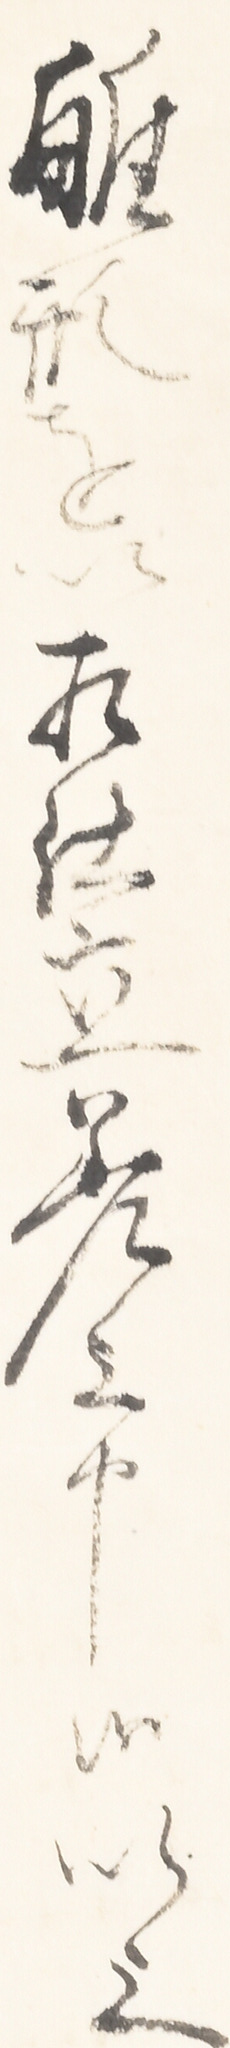雛形を以相仕立差上申候以上
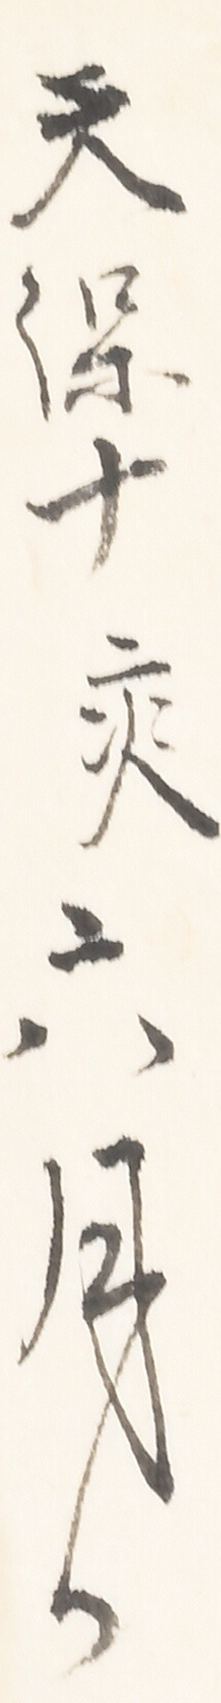天保十亥六月日
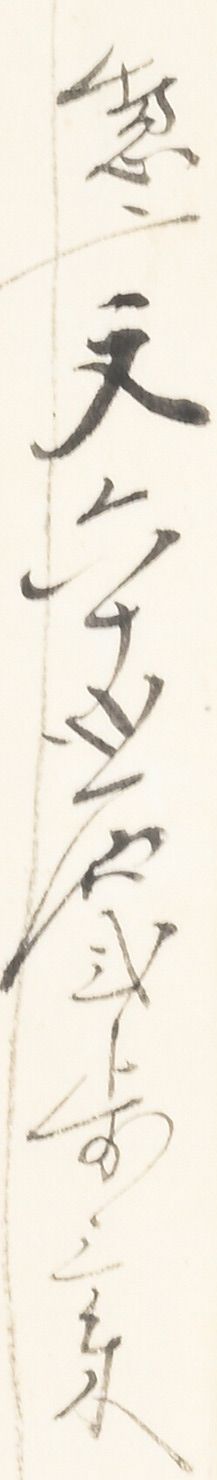惣〆文六十弐石弐歩三朱
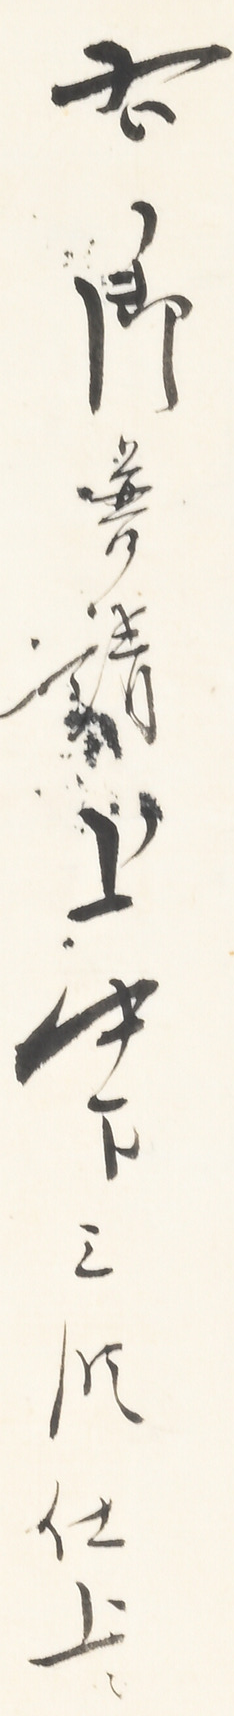右ノ御普請上中下三段仕上ニ
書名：天保十歳亥六月日玉垣御注文書上帳
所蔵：伊那市立高遠町図書館・合同会社AMANE
